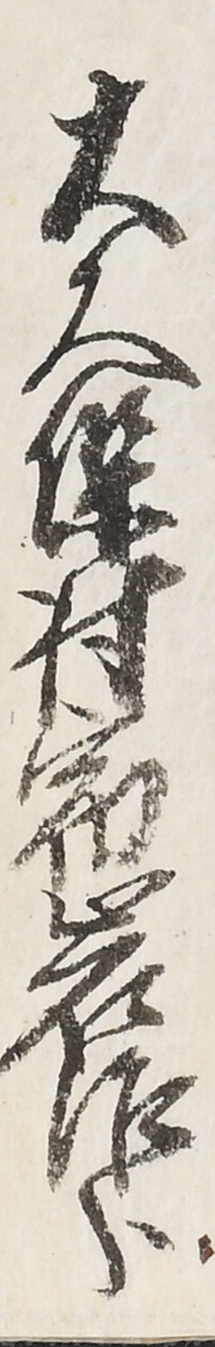大久保村宿岩治郎
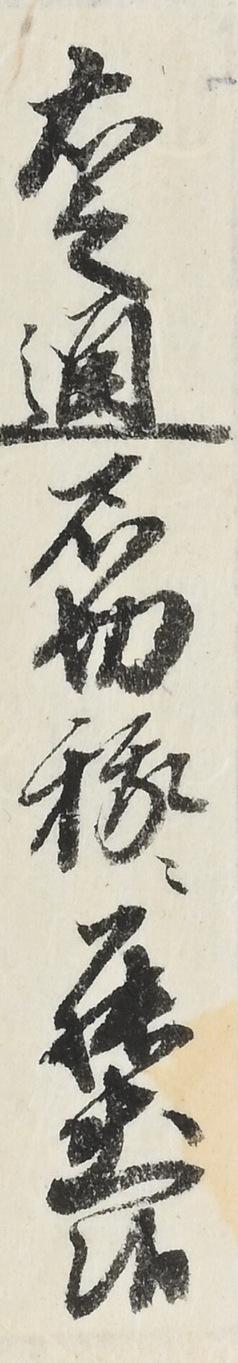右之通石切稼ニ罷出候
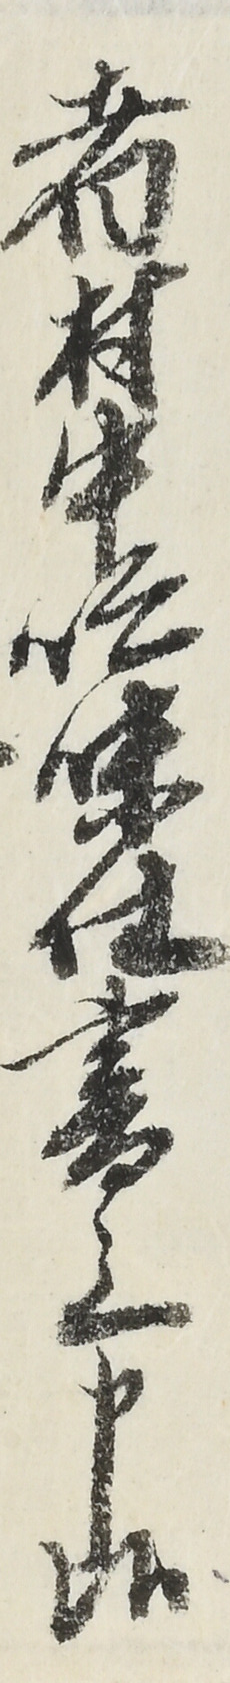者村中吟味仕書上申候
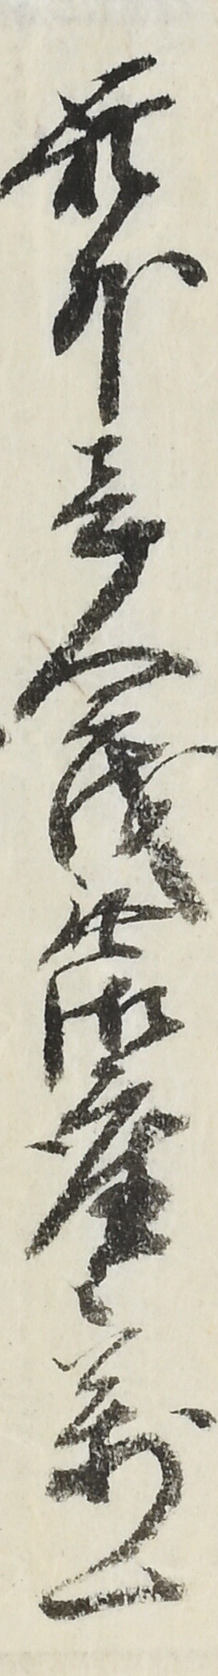此外壱人茂無御座候万一
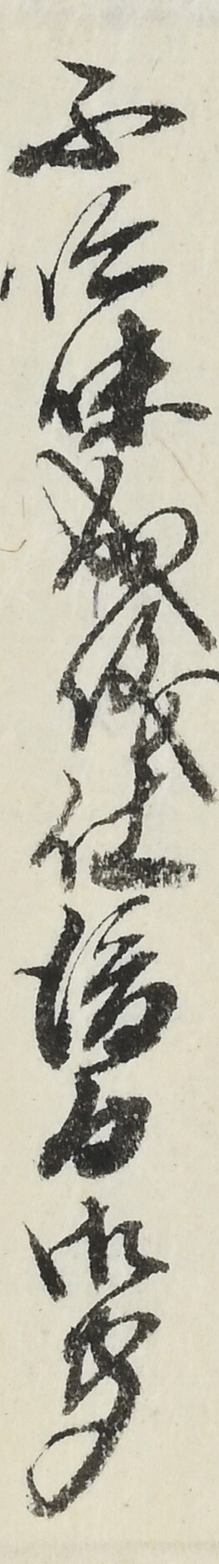不吟味成儀仕後日御聞
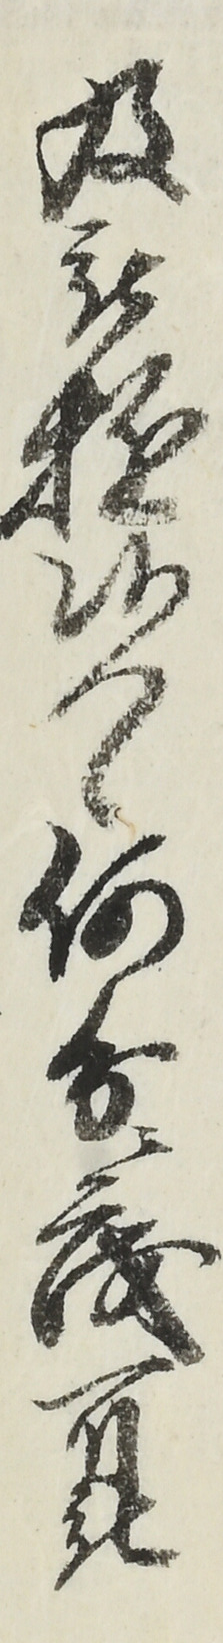及被遊候ハヽ何分ニ茂可被
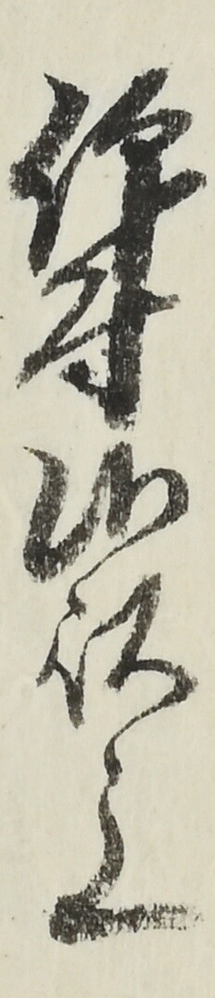仰付候以上

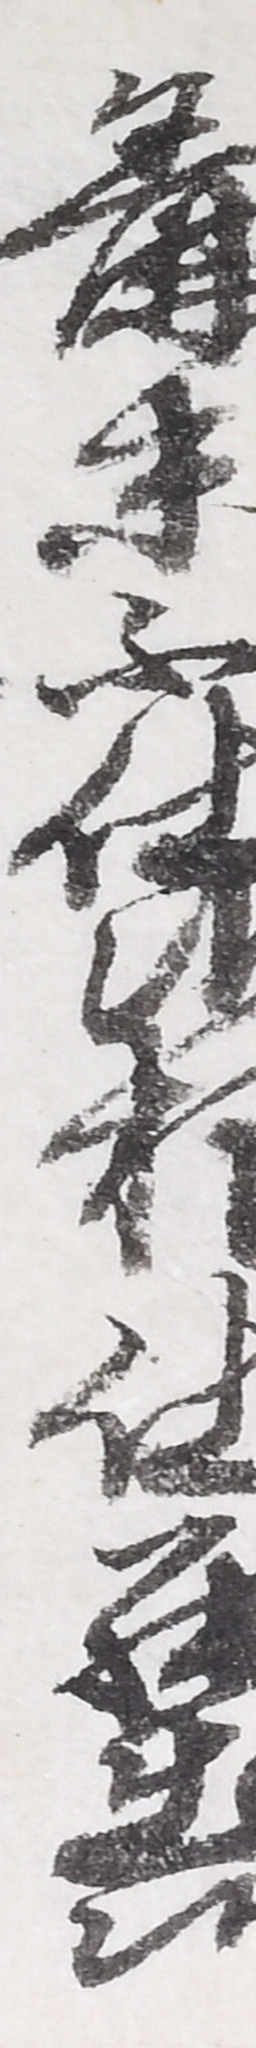麤末不仕候様ニ仕罷出候
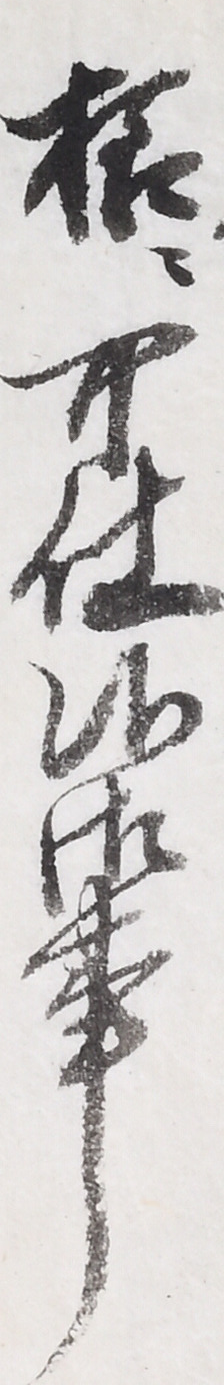様ニ可仕候御事
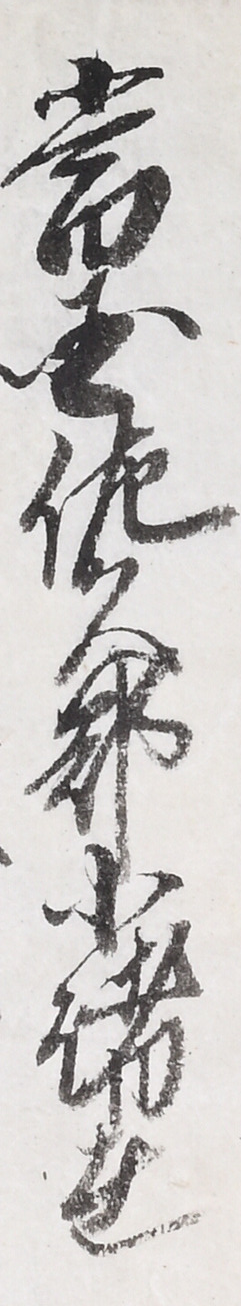当国佐久郡小諸在
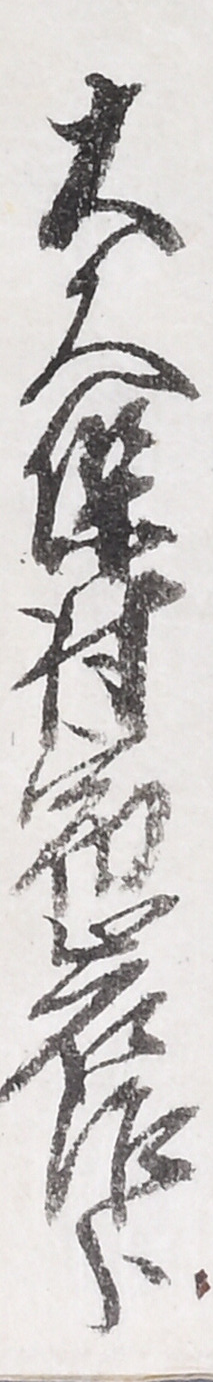大久保村宿岩治郎
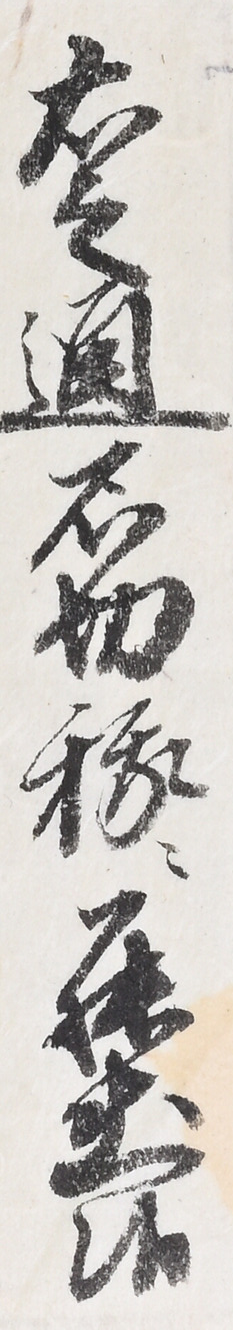右之通石切稼ニ罷出候
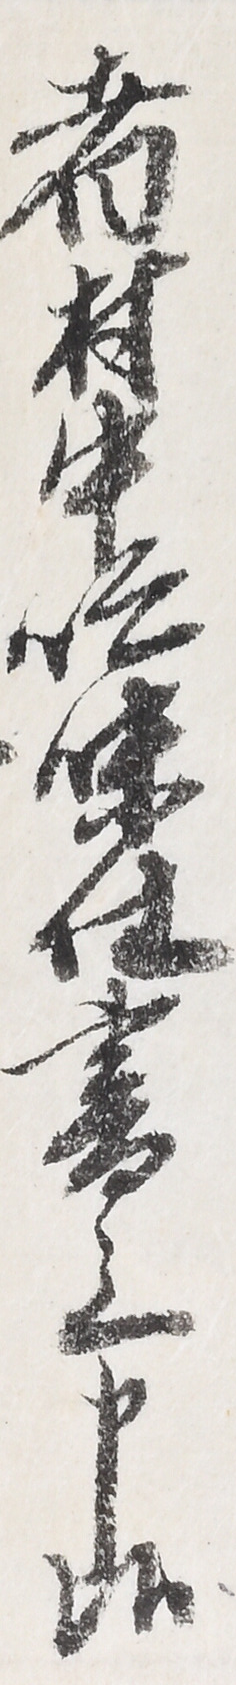者村中吟味仕書上申候
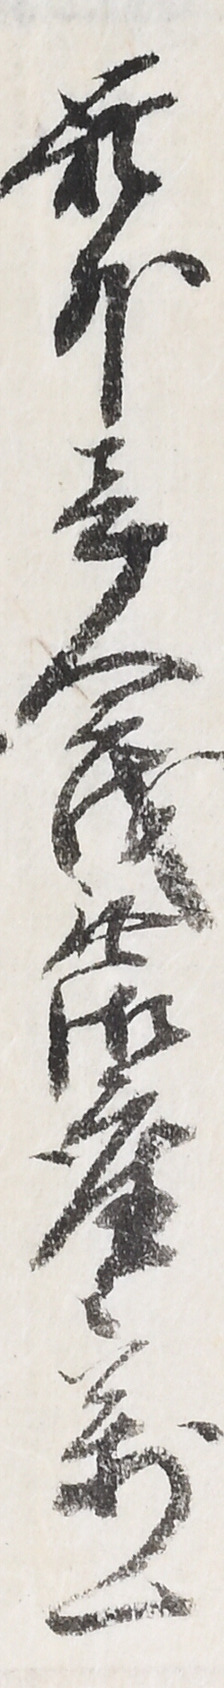此外壱人も無御座候万一
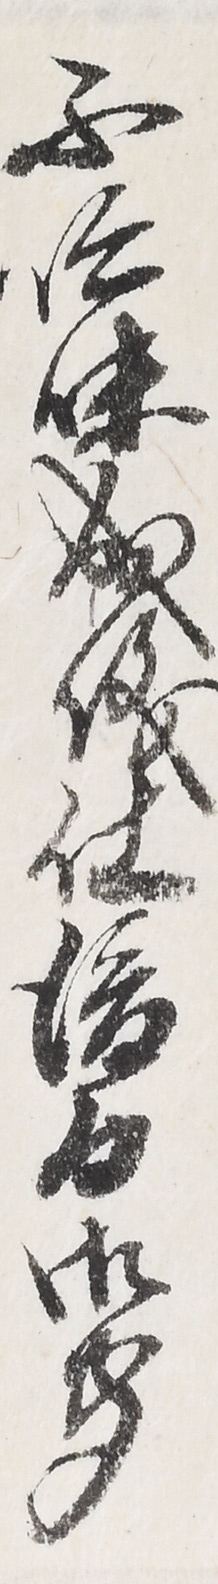不吟味成儀後日御聞
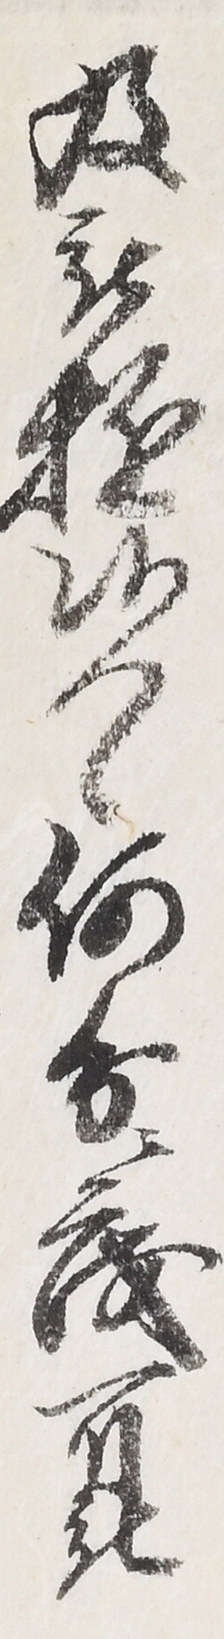及被遊候ハヽ何分ニも可被
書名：安政七庚申年正月石切旅稼名前書上帳
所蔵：伊那市立高遠町図書館・合同会社AMANE
